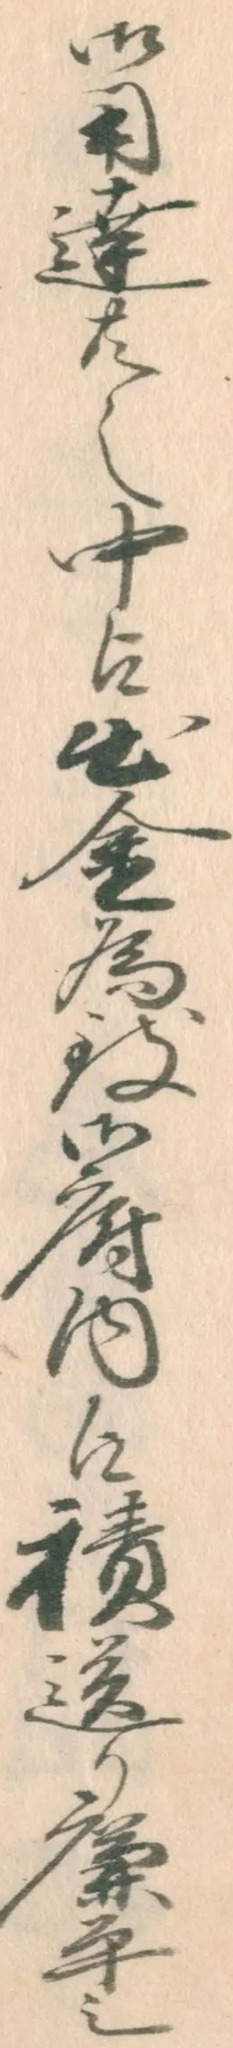御用達共之中ゟ出金為致御府内え積送り廉平之
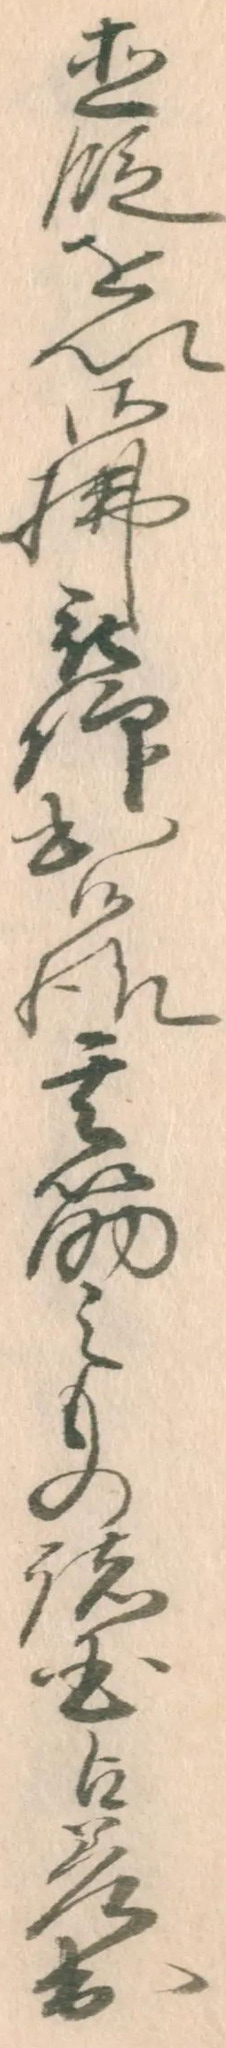直段を以御払被仰出候様其筋之もの諸国え差出
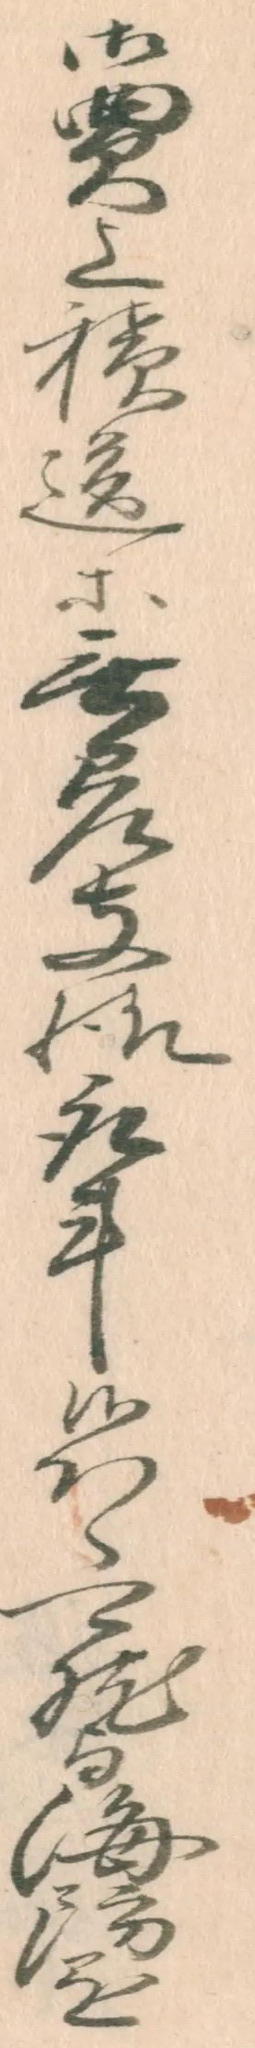御買上ケ積送等無差支様取計候ハヽ可然と海防懸
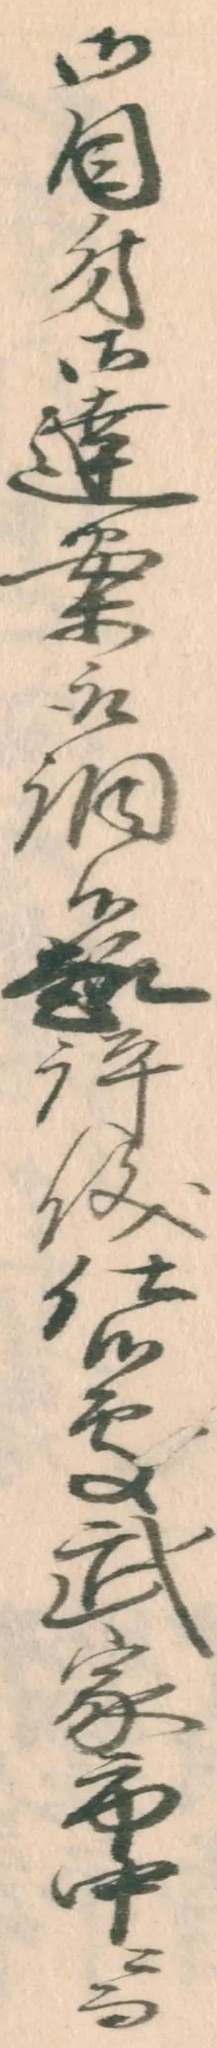御目御達案取調候趣評儀仕候処武家市中ニて
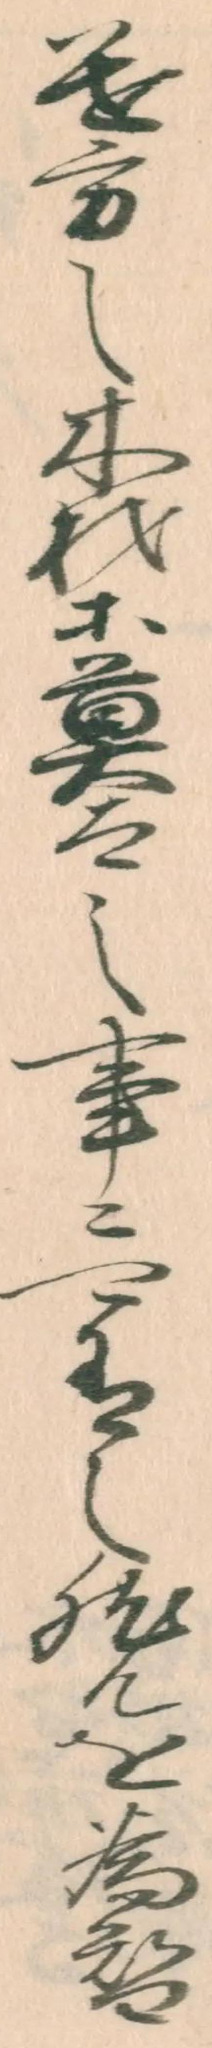遣方之木材等莫太之事ニ可有之然ルを為替
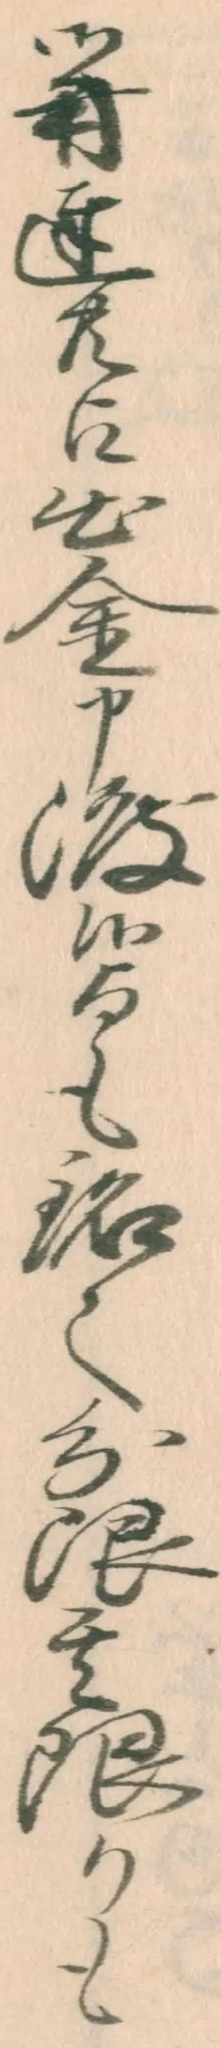御用達共え出金申渡候ても銘〻分限其限りも
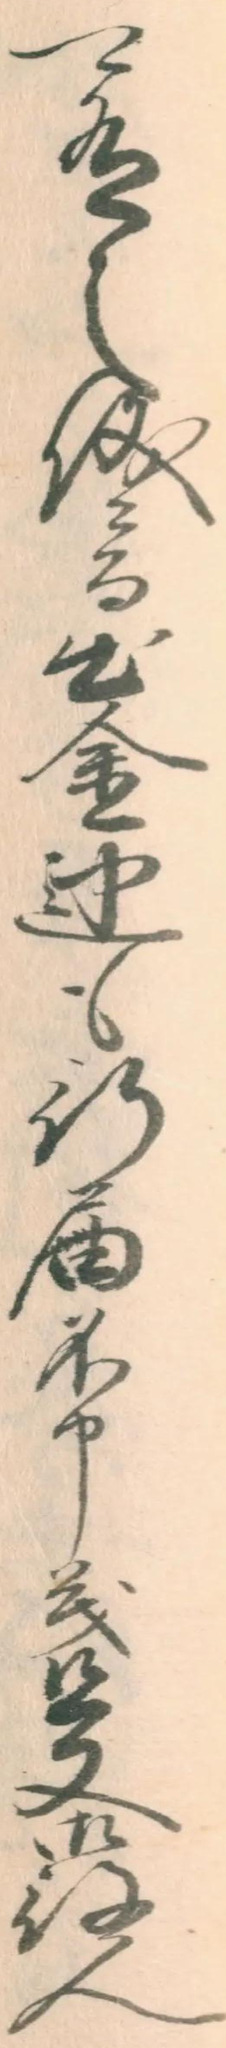可有之儀ニて出金迚も行届不申義且又御役人
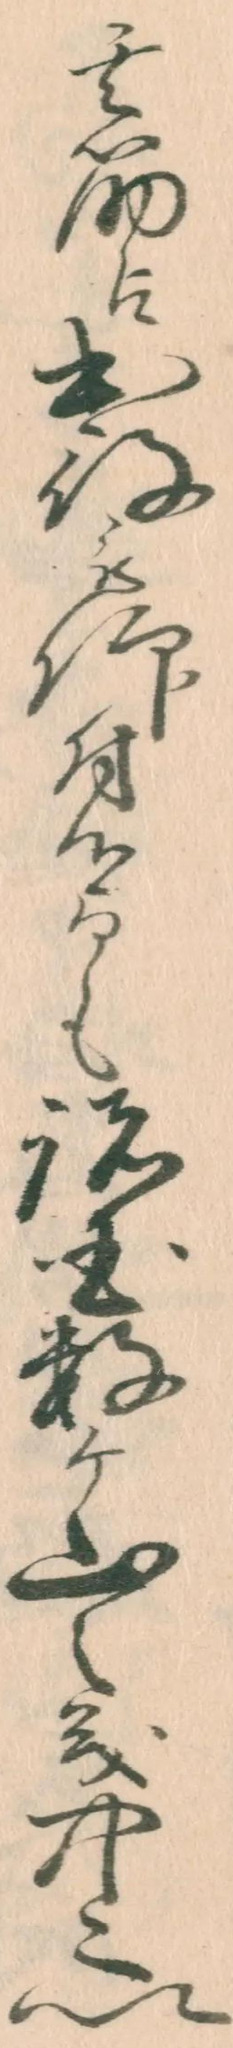其筋え出役被仰付候ても諸国数ケ山の義中〻以
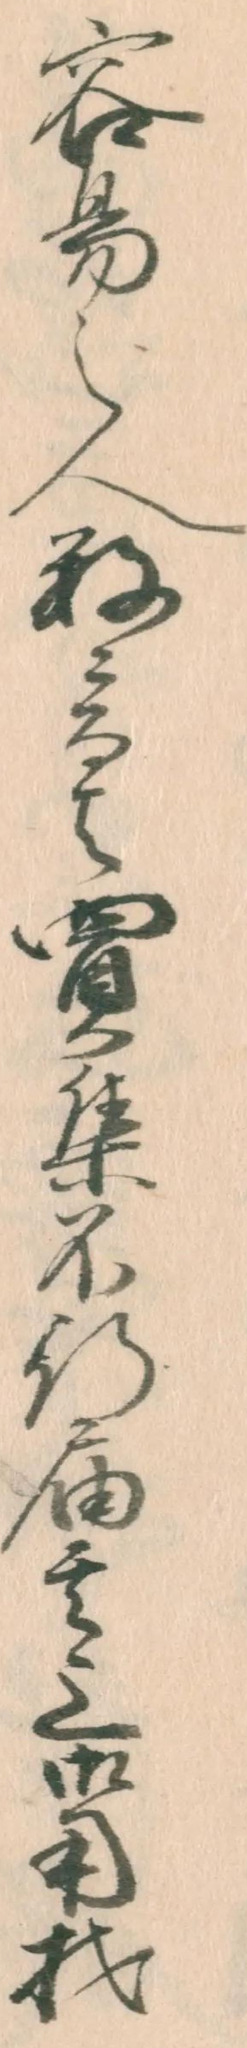容易之人数ニては買集不行届其上御用材
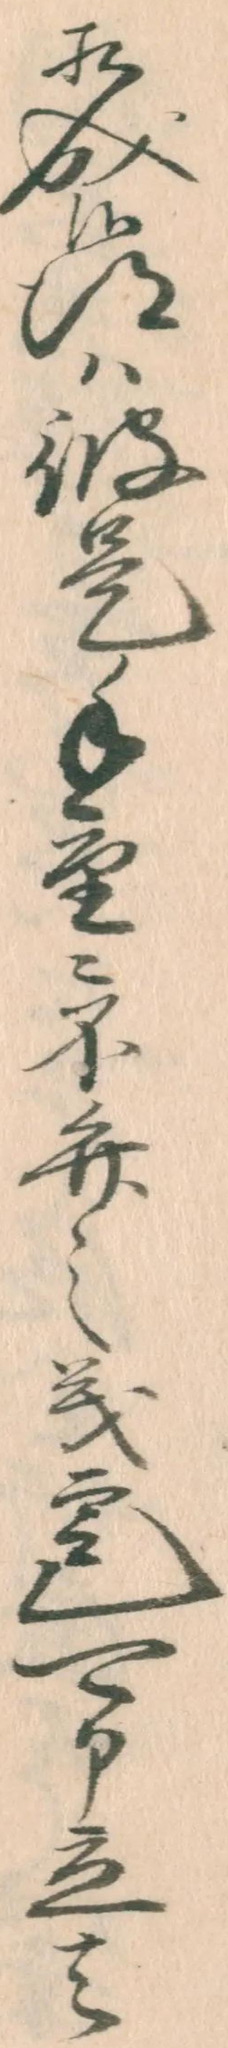相成候得ハ彼是手重ニ不弁之義而已可申立は
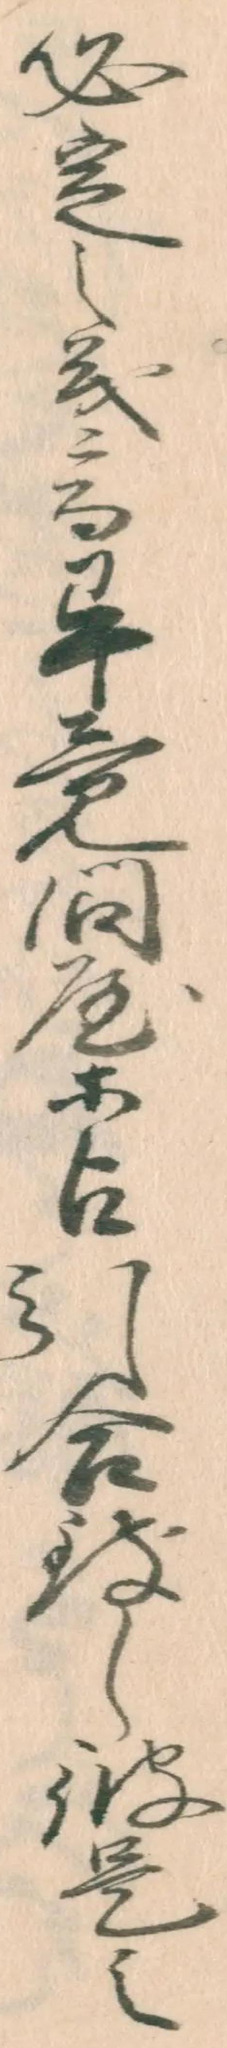必定之義ニ而畢竟問屋等迄引合致し彼是之
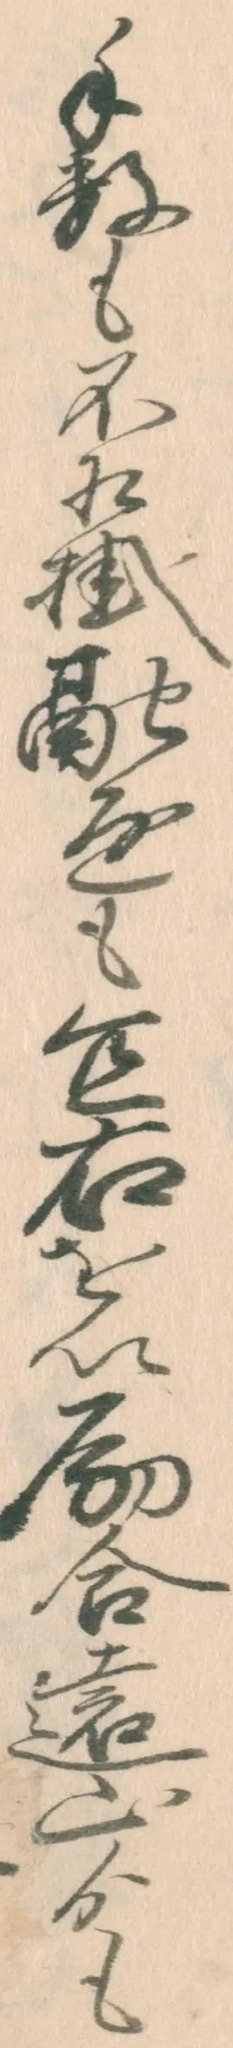手数も不相掛融通も宜右を以励合遠山ゟも
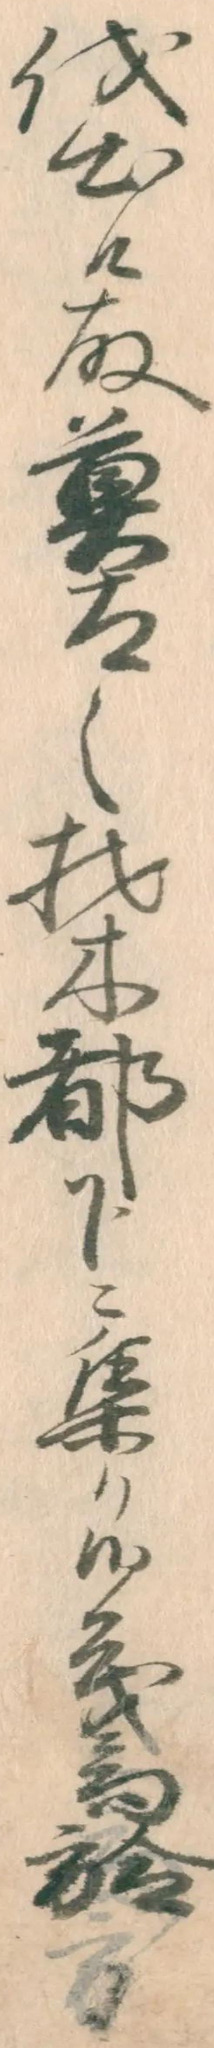伐出候故莫太之材木都下ニ集り候義ニて於

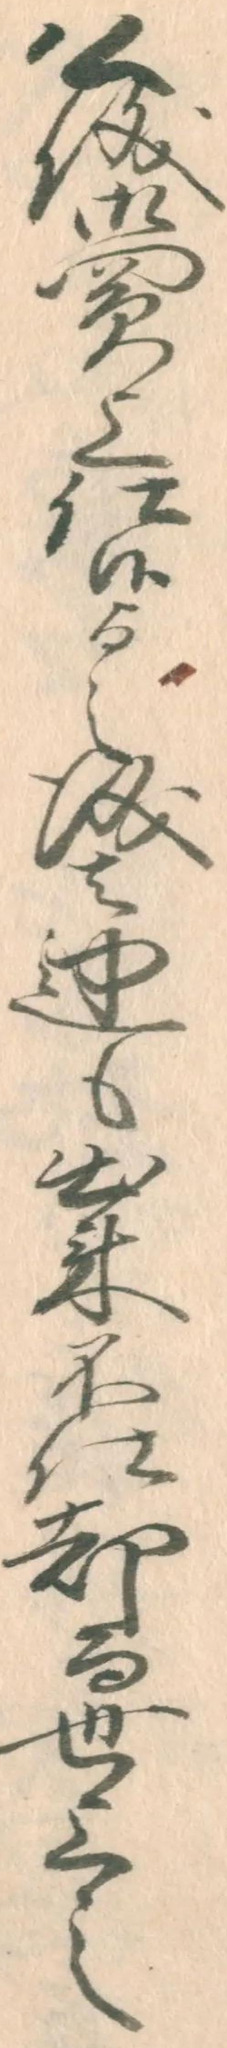公儀御買上仕候と之儀は迚も出来不仕却て世上之
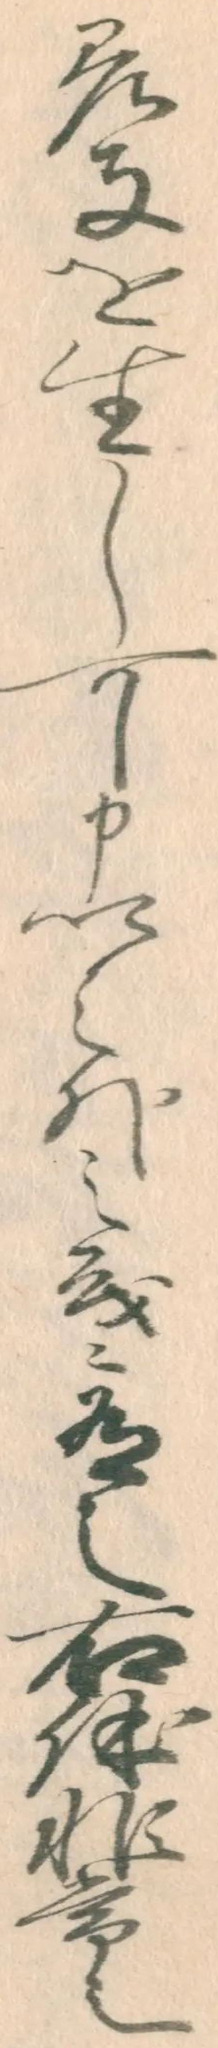差支を生し可申以之外之義ニ有之右体非常之
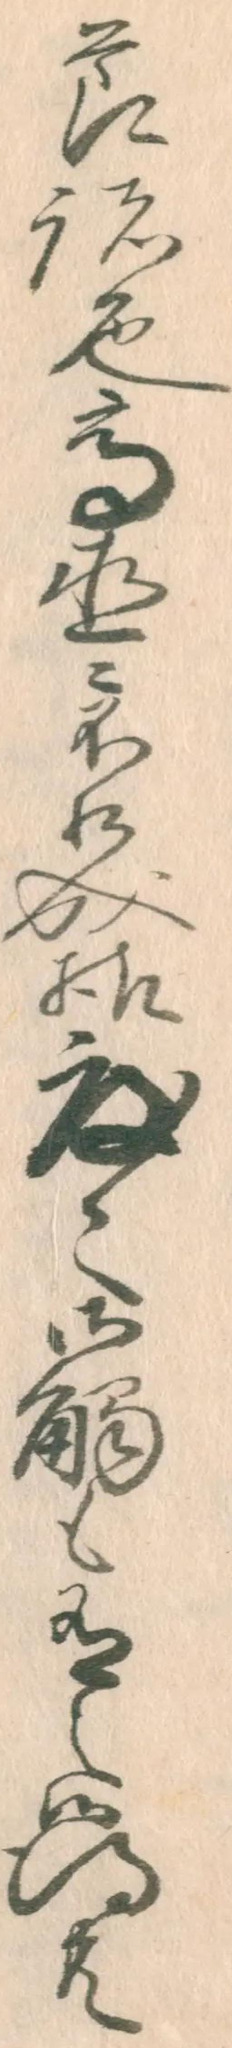節諸色高直ニ不相成様度〻御触も有之候得共
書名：地震災書留 2巻. [2] 内表紙に「地震一件　安政二卯年十月」とあり
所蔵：国立国会図書館 National Diet Library, JAPAN
